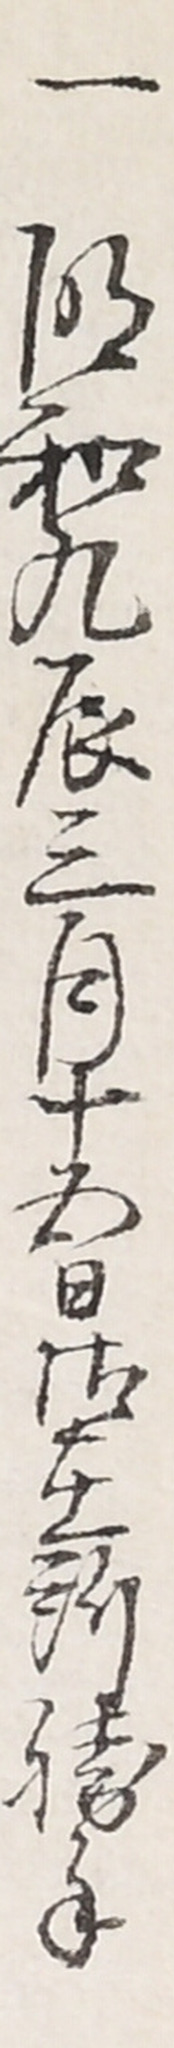一明和九辰三月十五日御在所勝手
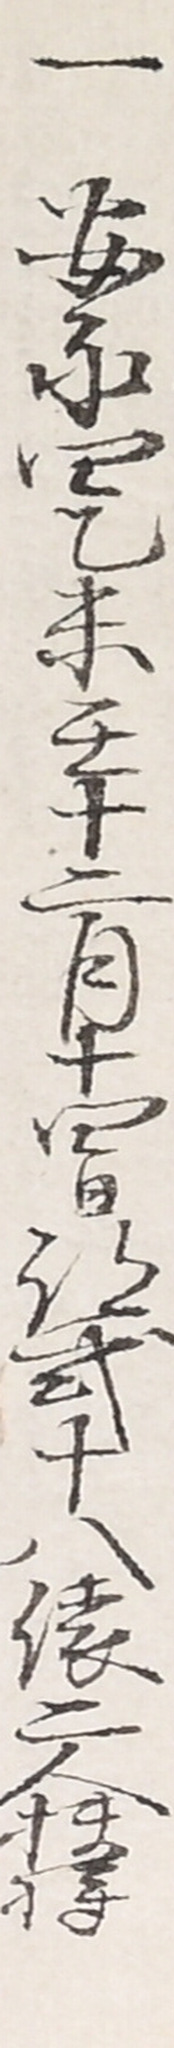一安永四乙未閏十二月十四日跡式十八俵二人扶持
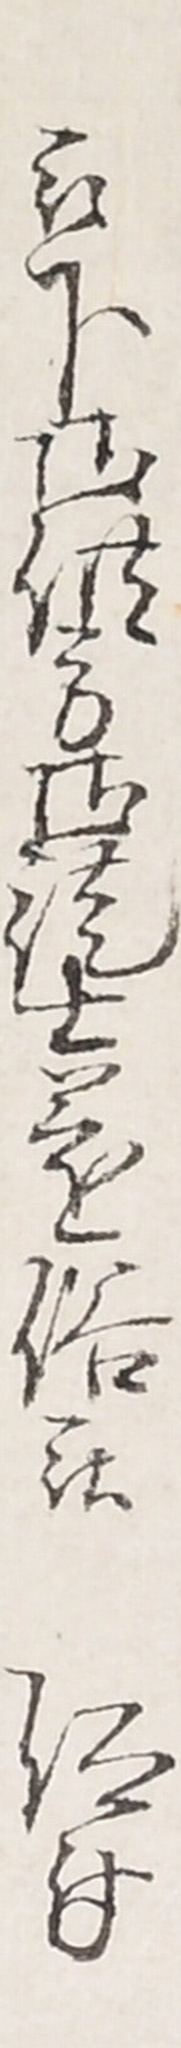被下御供方御徒士還俗被仰付
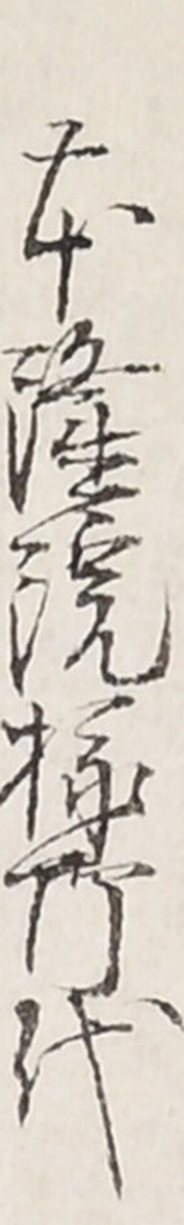本隆院様御代
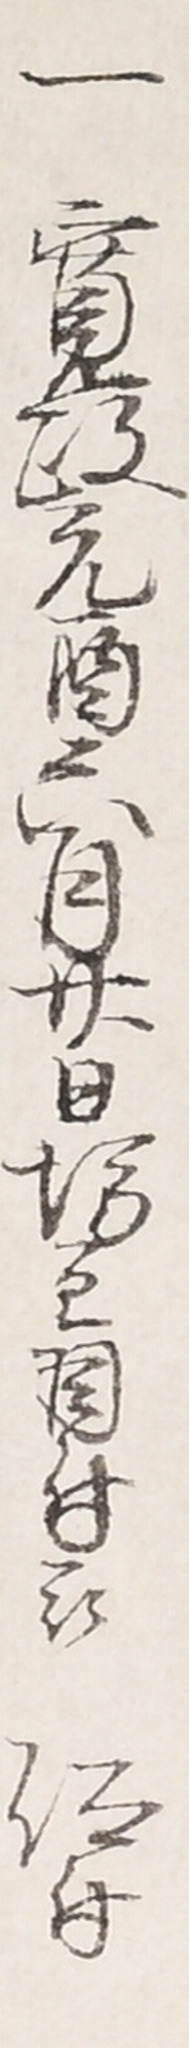一寛政元酉六月廿日坊主目付被仰付
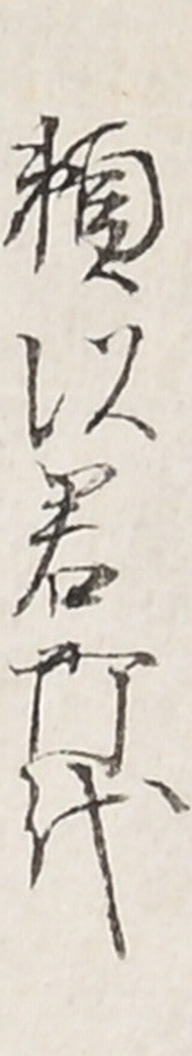頼以君御代
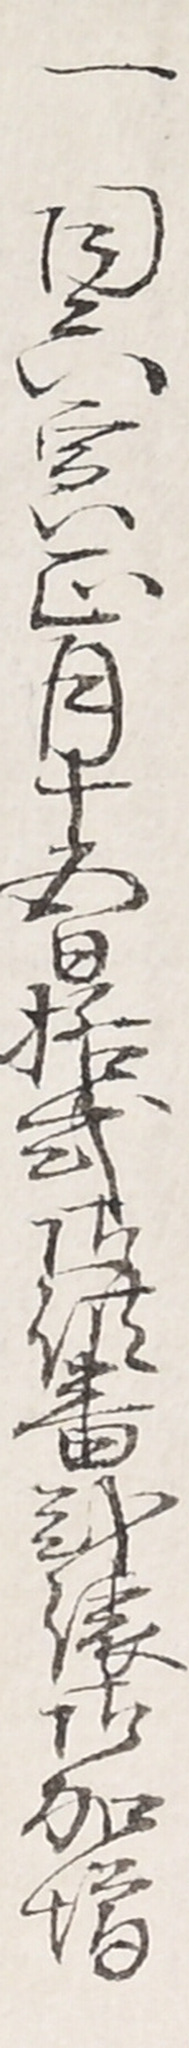一同六寅正月十五日格式御供番弐俵御加増
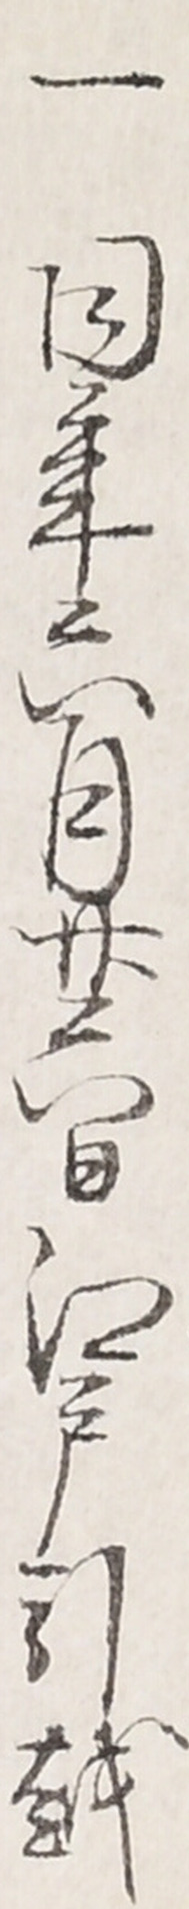一同年六月廿六日江戸引越
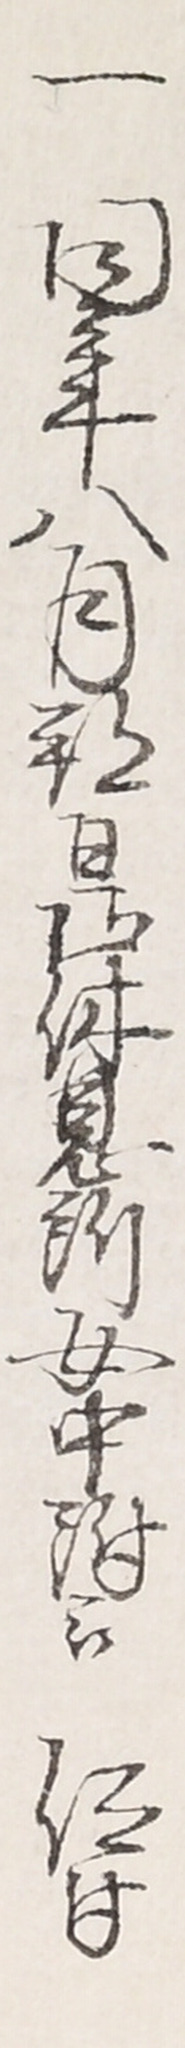一同年八月朔日御休息所女中附被仰付
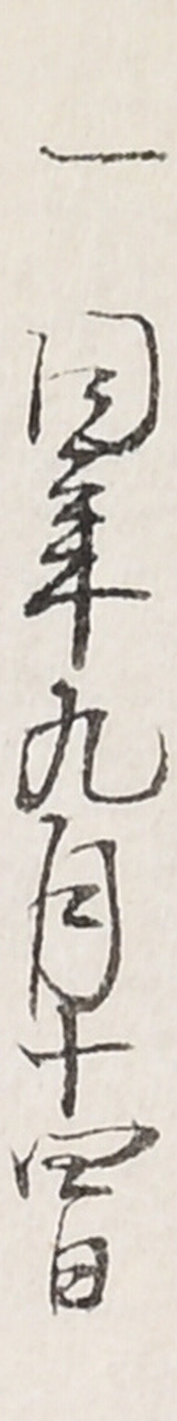一同年九月十四日
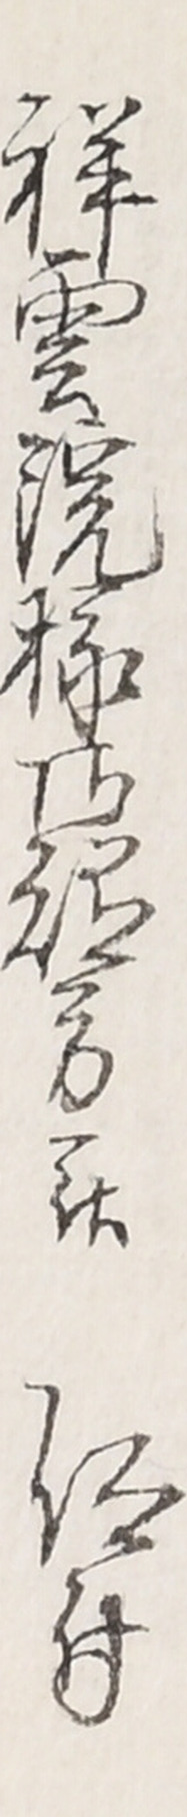祥雲院様御賄方被仰付
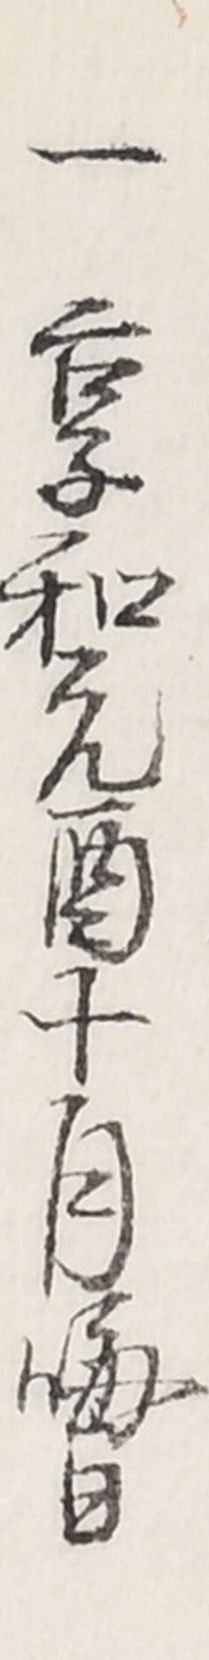一享和元酉十月晦日
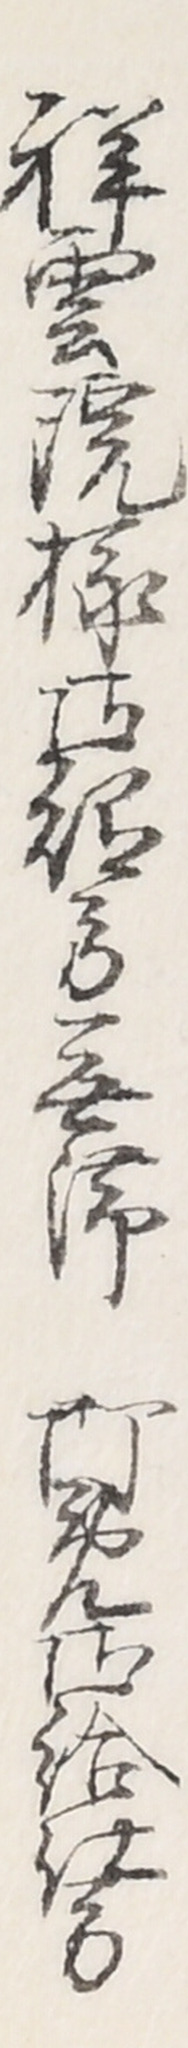祥雲院様御賄方無滞御免御給仕方
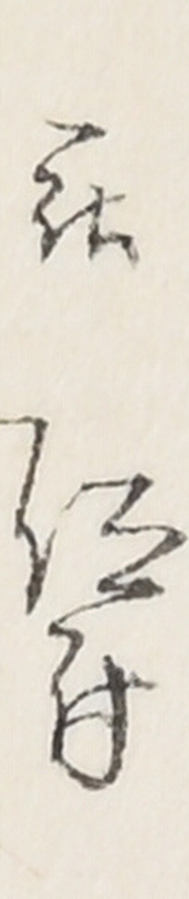被仰付
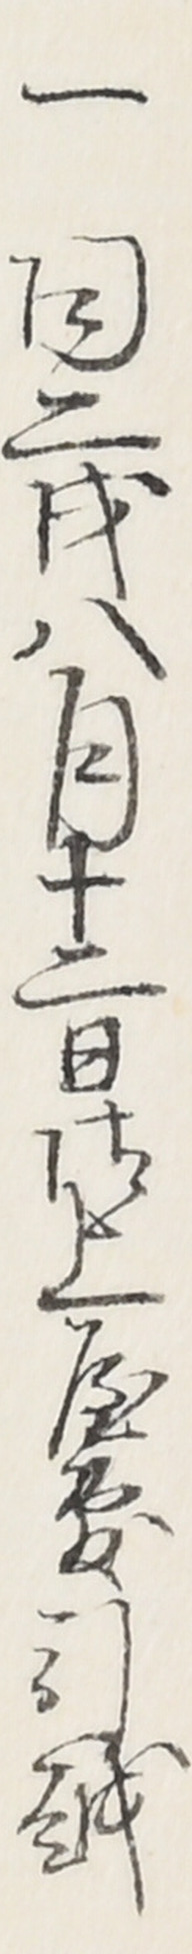一同二戌八月十二日御上屋敷引越
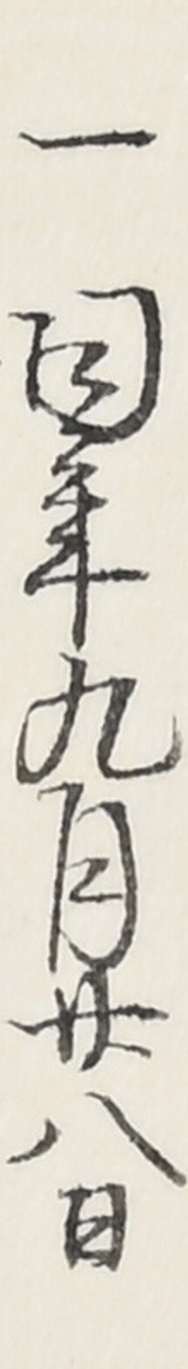一同年九月廿八日
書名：無足諸士勤仕録（四）
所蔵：伊那市立高遠町図書館・合同会社AMANE
